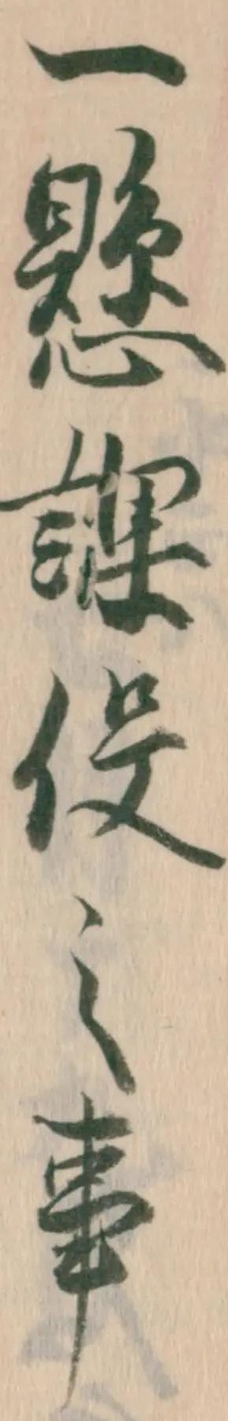一懸課役之事
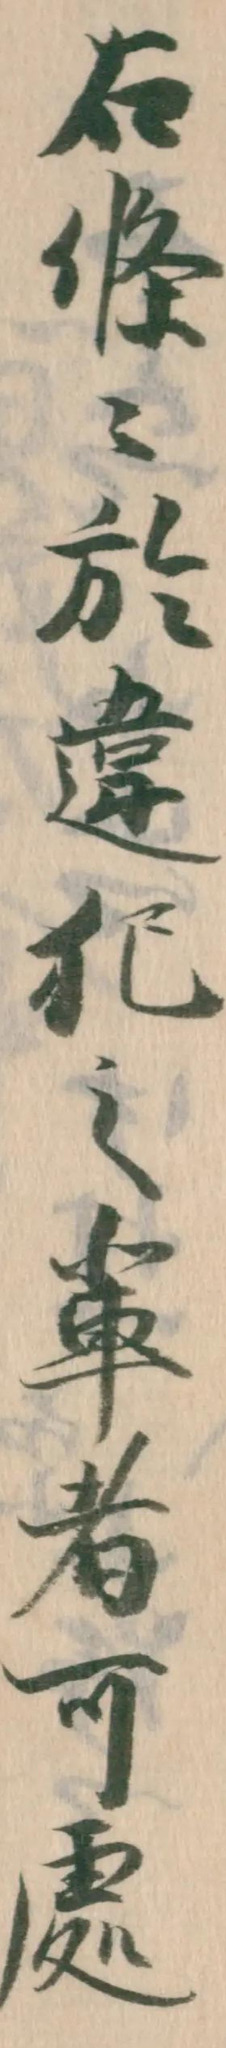右条々於違犯之輩者可処
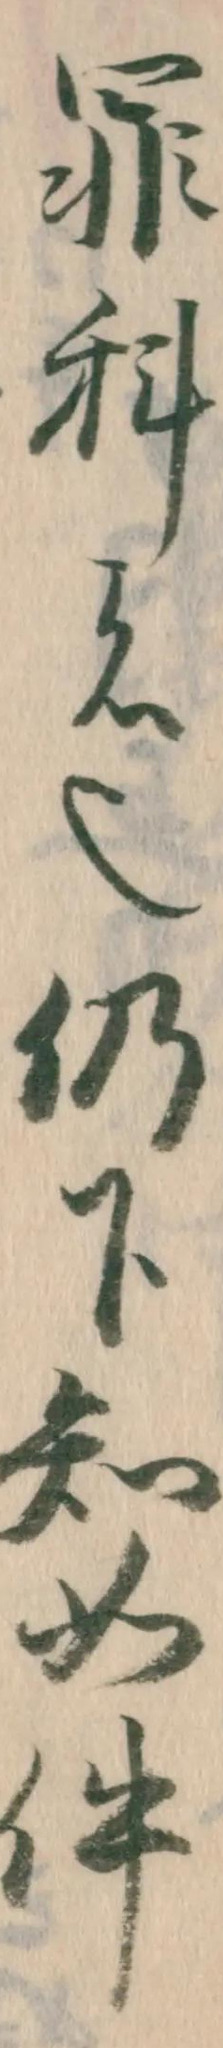罪科者也仍下知如件
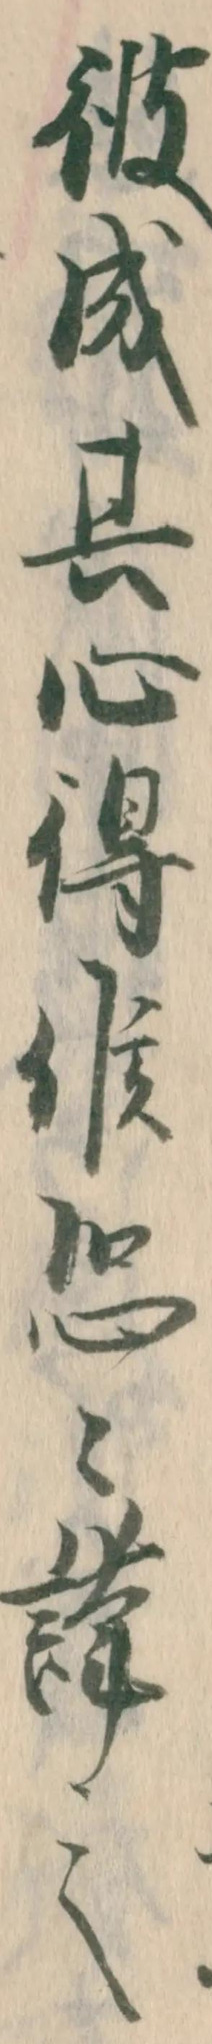彼成其心得候恐々謹言

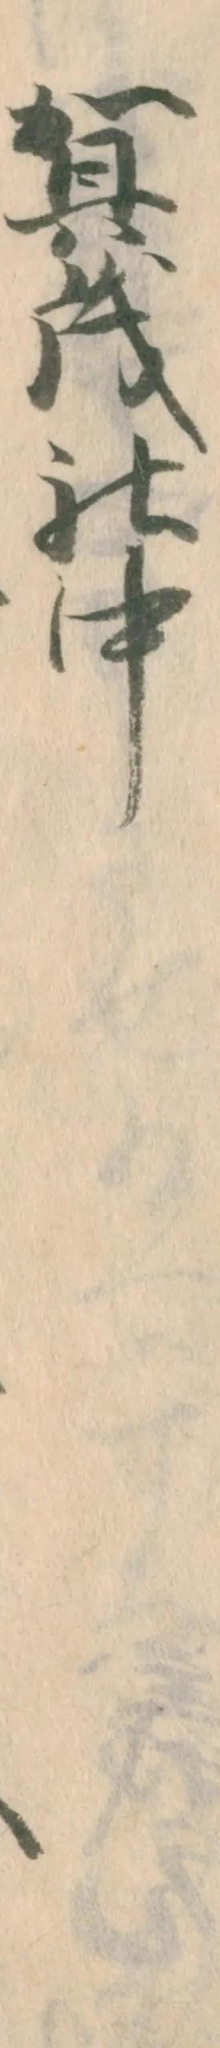賀茂社中
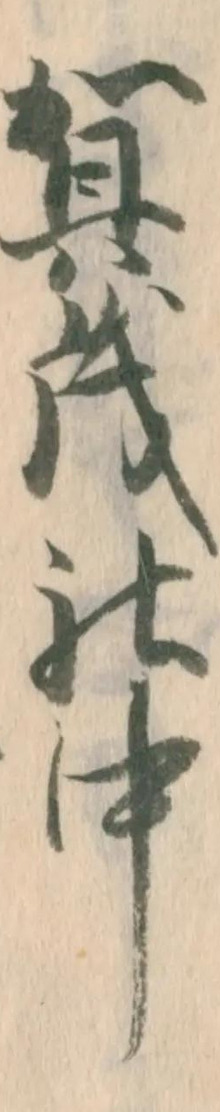賀茂社中
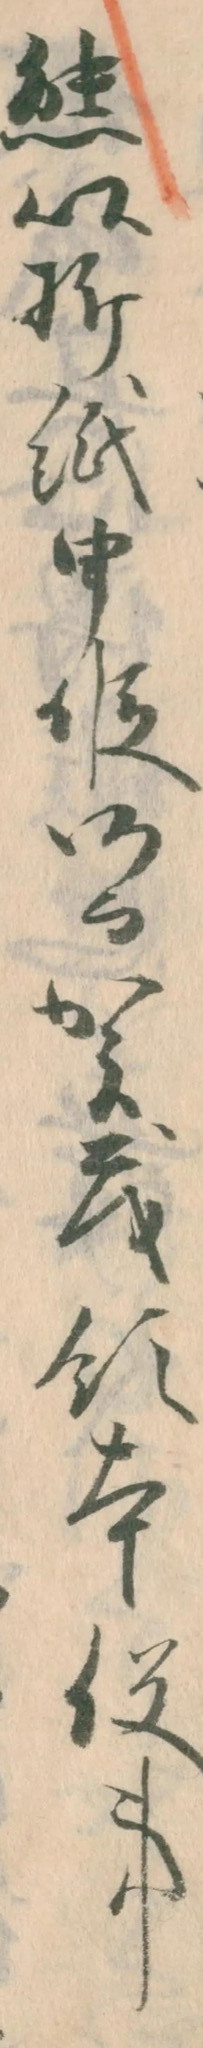態以折紙申候仍而賀茂領本役事
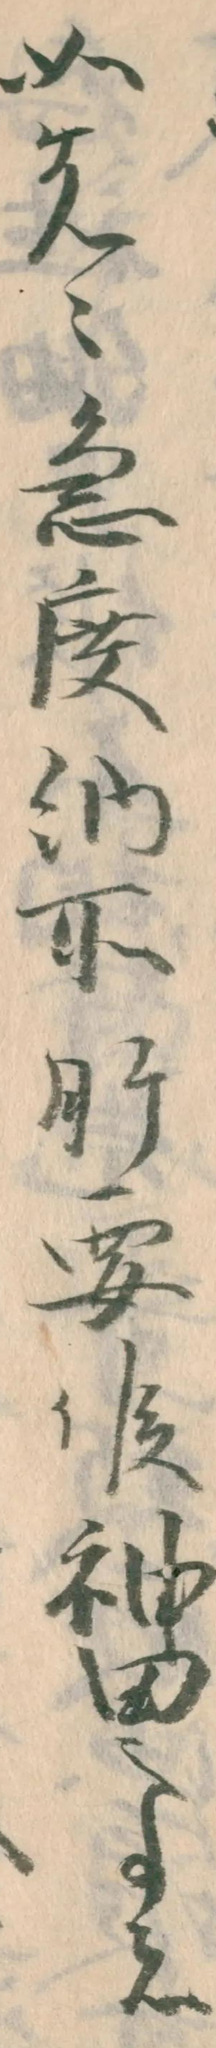如先々急度納所肝要候神田之事者
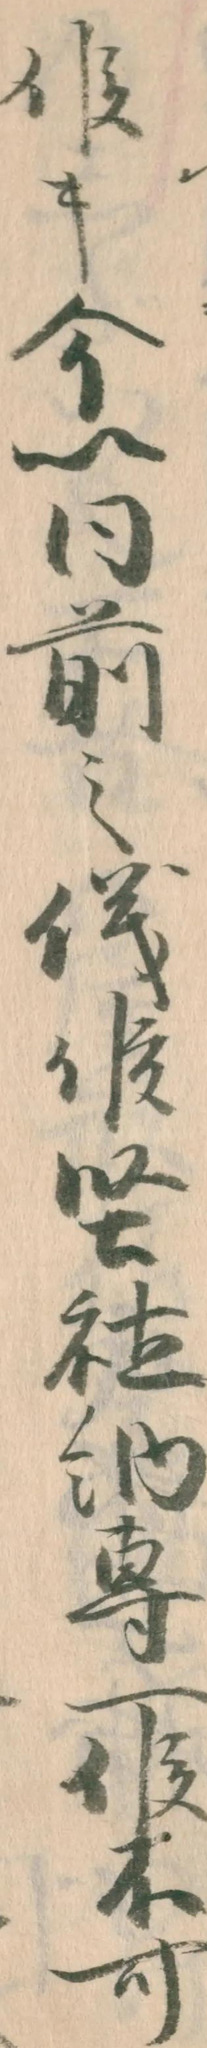候キ今以同前之儀候堅社納専一候不可
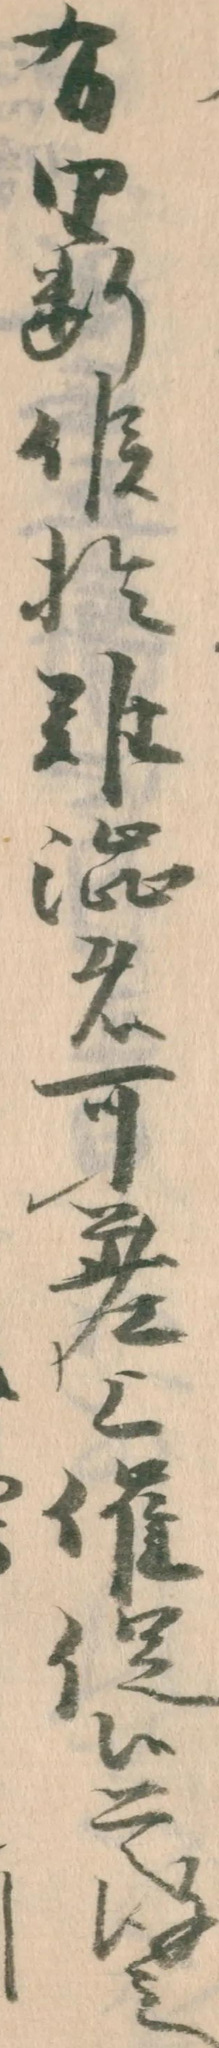有由断候於難渋者可差-上催促候恐々謹言
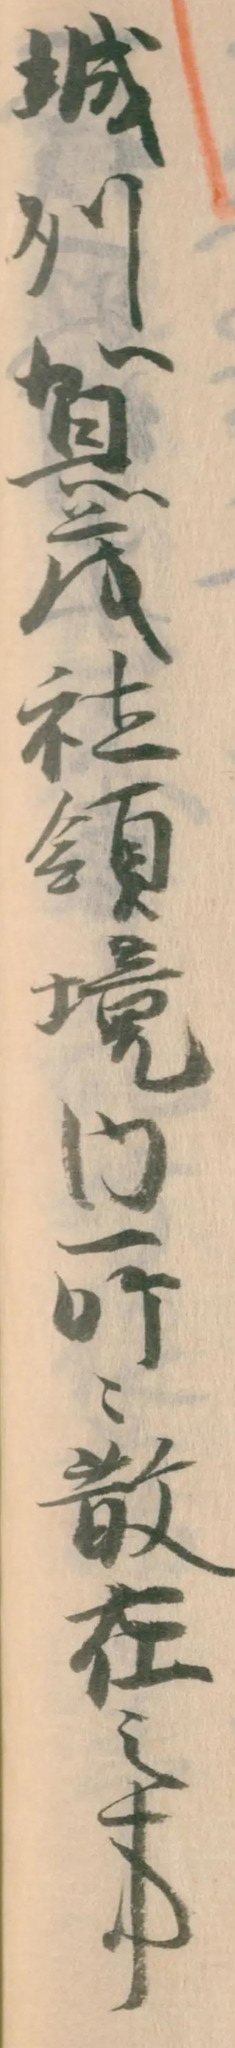城州賀茂社領境内所々散在之事
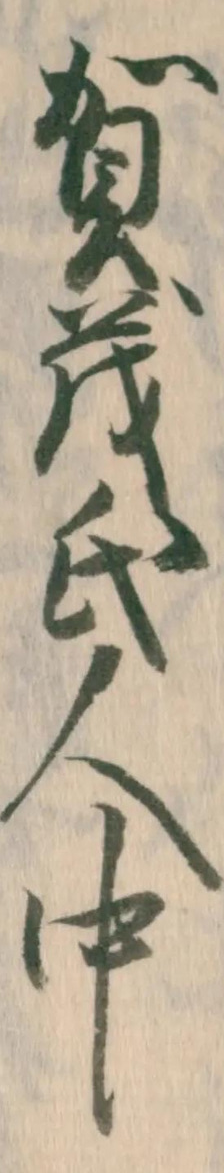賀茂氏人中
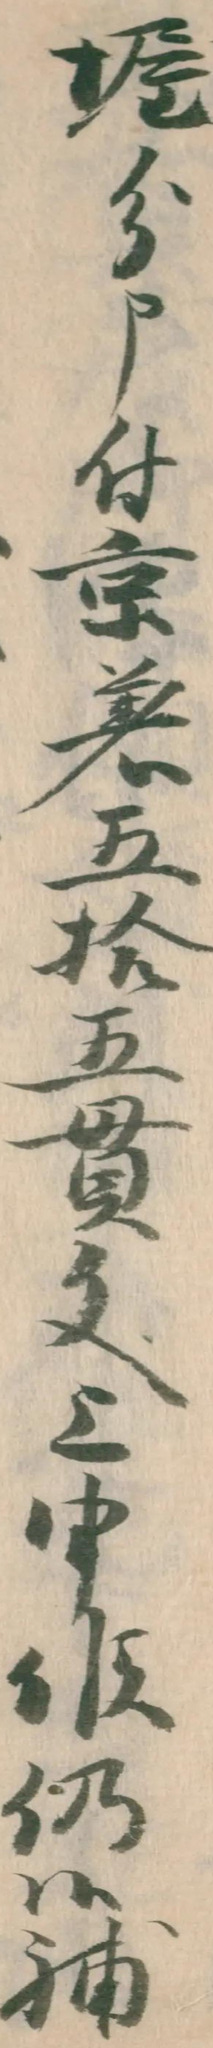涯分申付京着五拾五貫文上申候仍御補
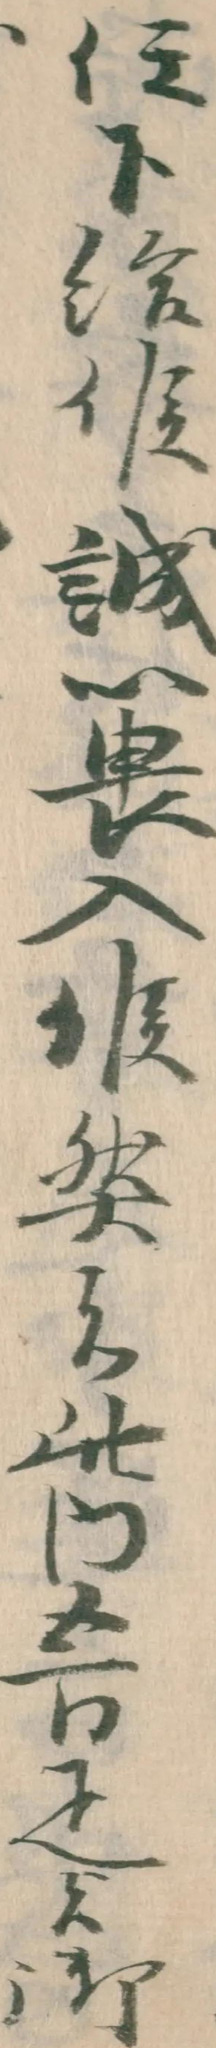任下給候誠以畏入候然者此内五百疋者御
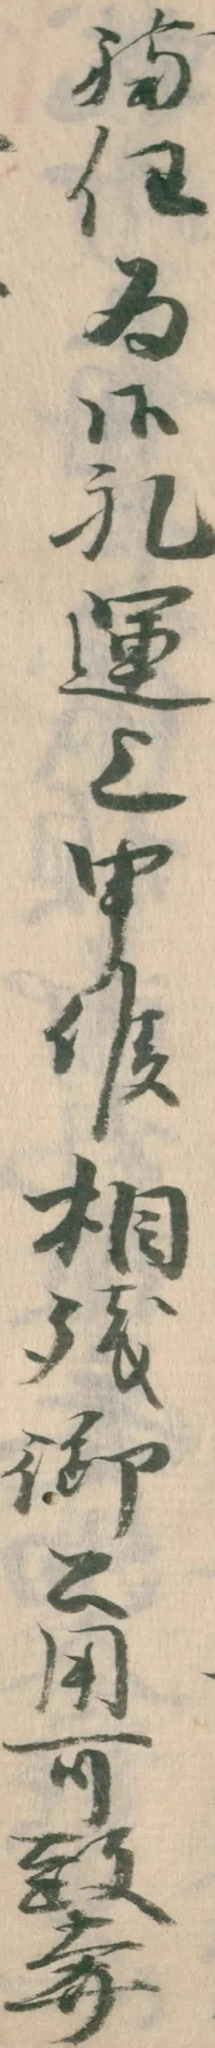補任為御礼運上申候相残御公用可致奔
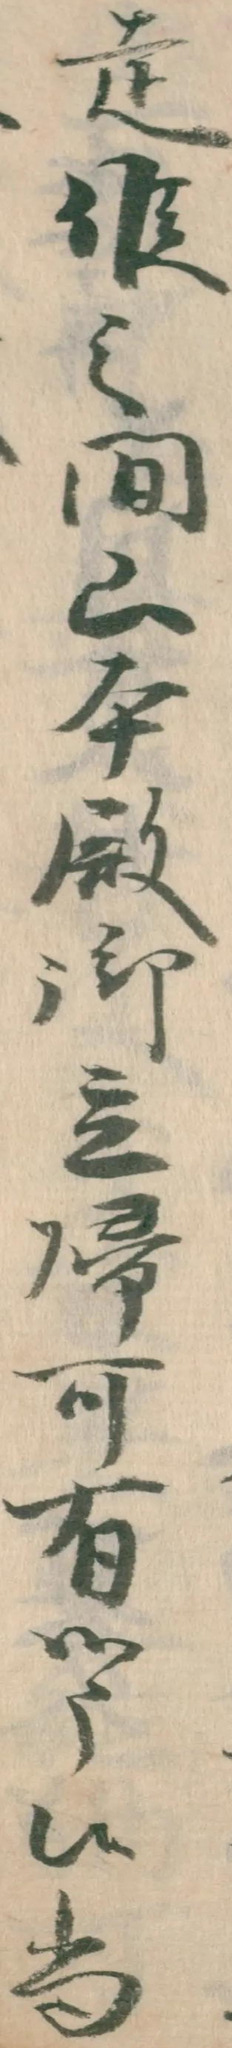走候之間山本殿御立帰可有御申候尚
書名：賀茂社記録. 第1冊
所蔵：国立国会図書館 National Diet Library, JAPAN
